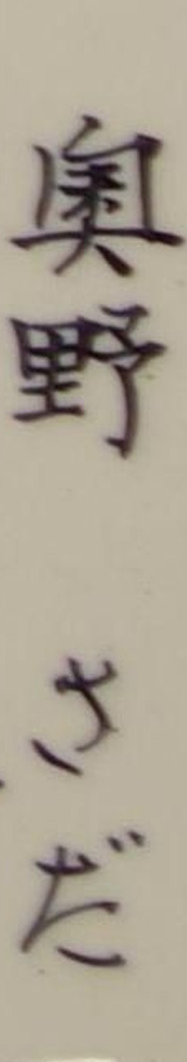奥野さだ
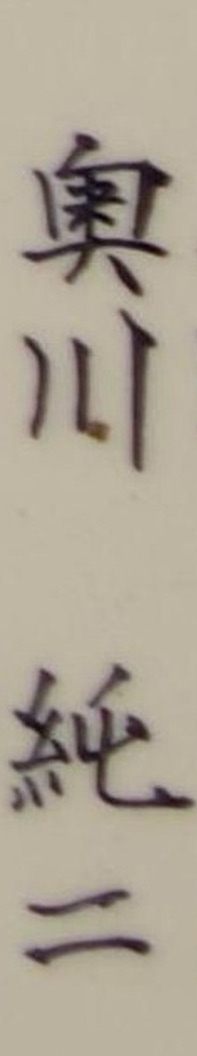奥川純二
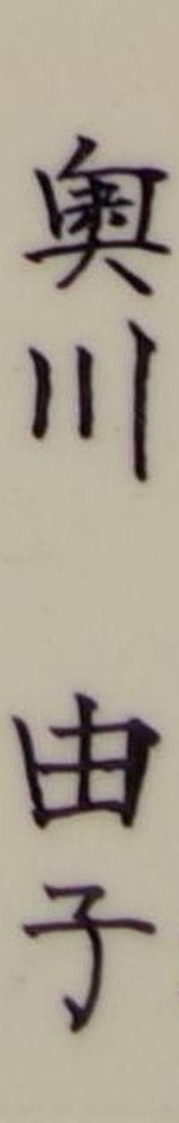奥川由子
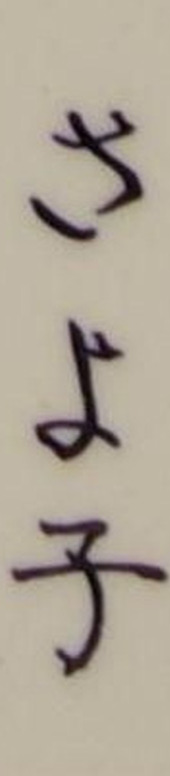さよ子
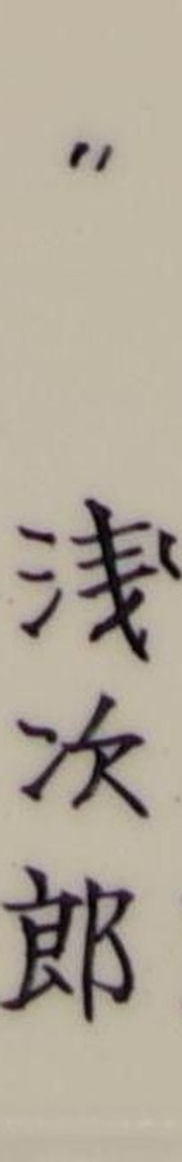浅次郎
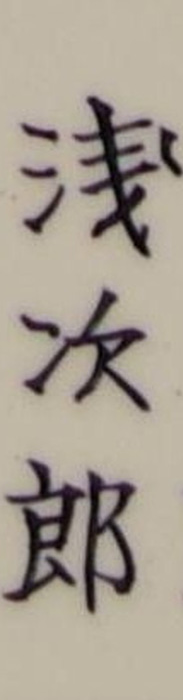浅次郎
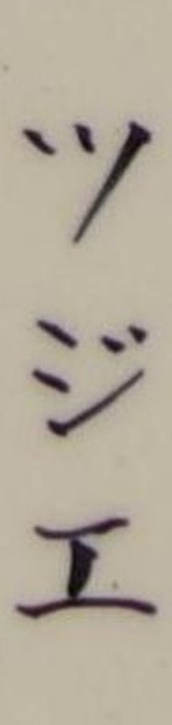ツジエ
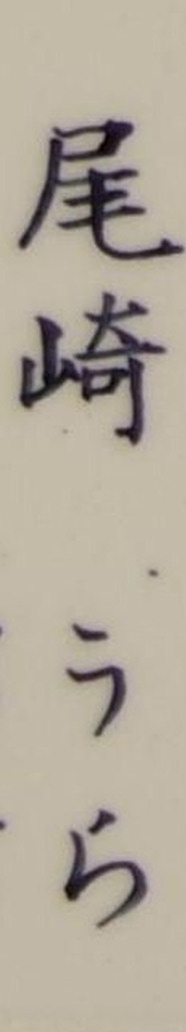尾崎うら

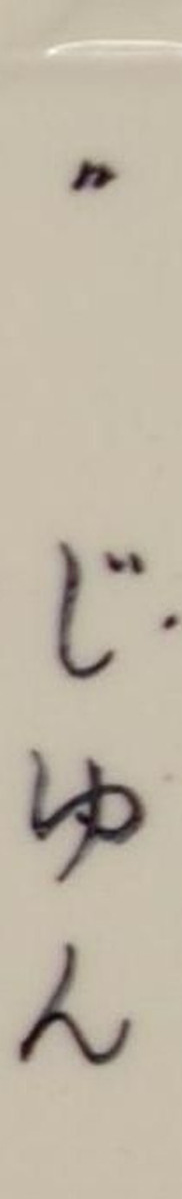じゆん
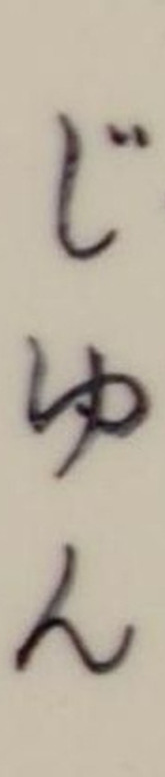じゆん
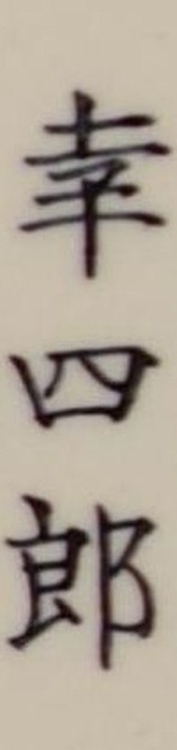幸四郎
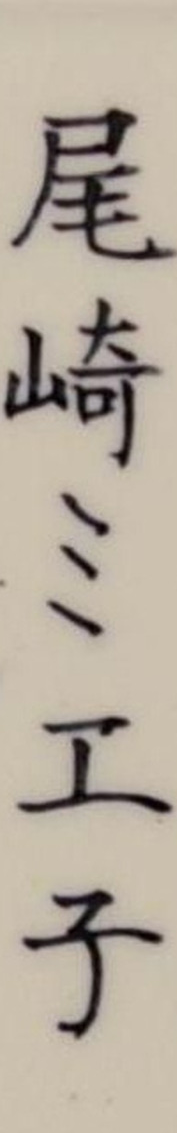尾崎ミエ子
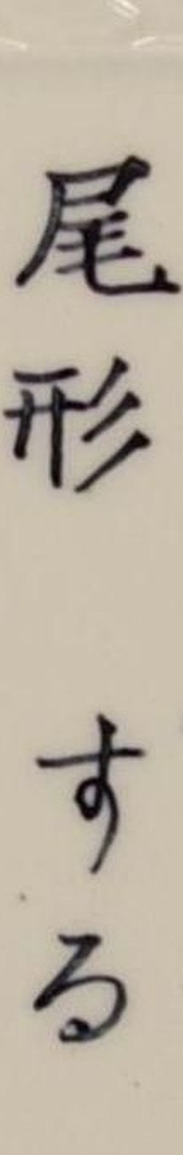尾形する
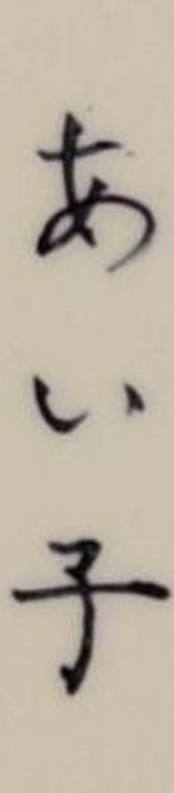あい子
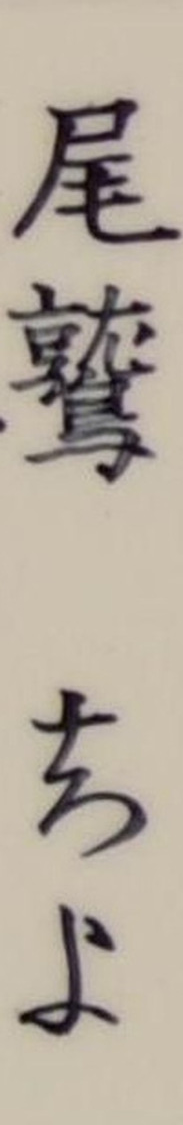尾鷲ちよ
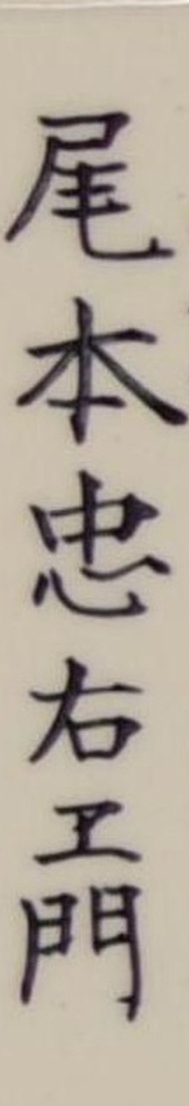尾本忠右エ門
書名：E~L
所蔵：高野山金剛峯寺
